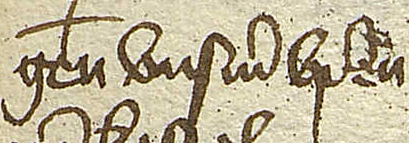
gen vnſm* hr*en
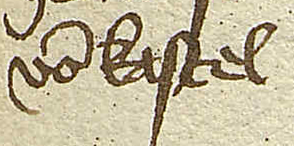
vo* kaſtel
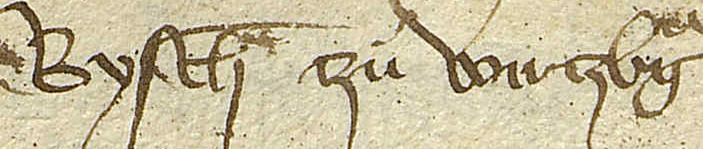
Byſch* cʒü Wircʒb*g
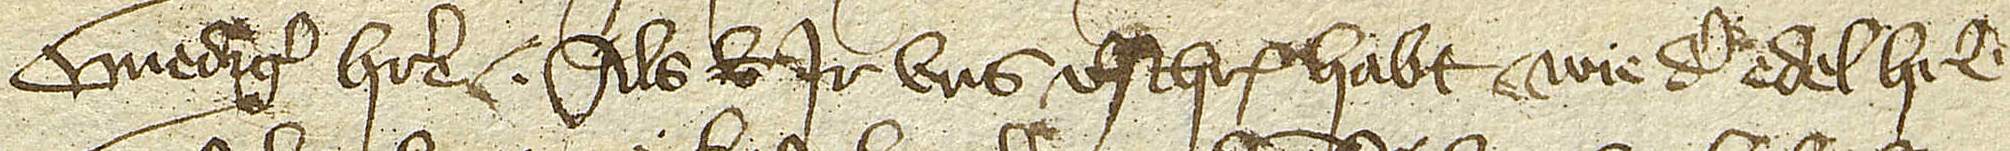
Gnedig* hr*e / . Als v Ir vns v*ſchr* habt / wie d* edel hr*e
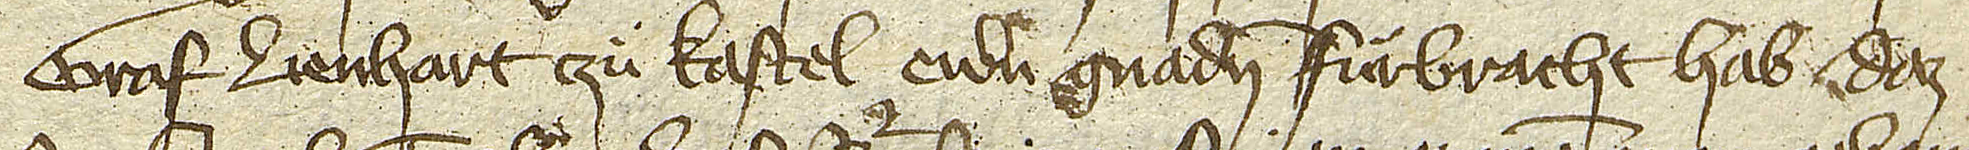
Graf Lienhart cʒü kaſtel ew*n gnadn* fürbracht hab / daʒ
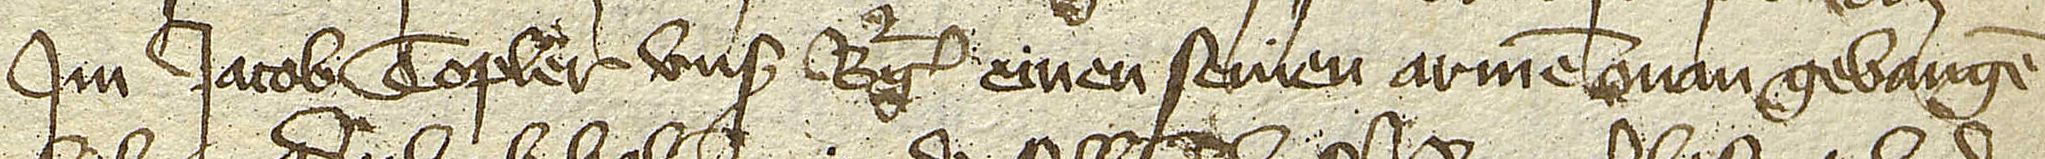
Im Iacob Topler vnſ* B*g* einen ſeinen arme* man gevange*
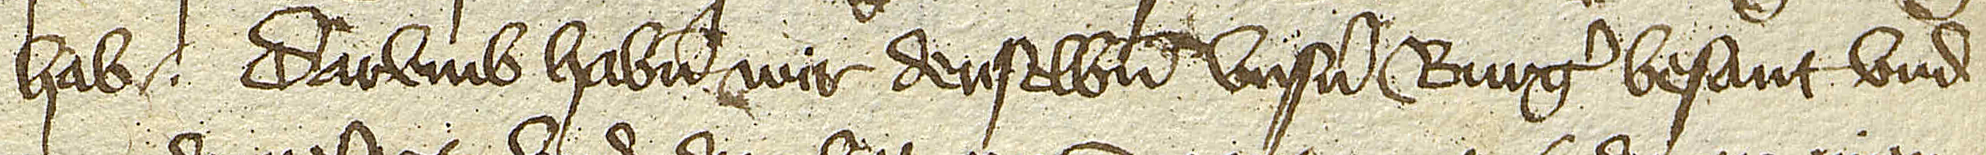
hab / . Darvmb habn* wir denſelbn* vnſn* Burg* beſant vnd
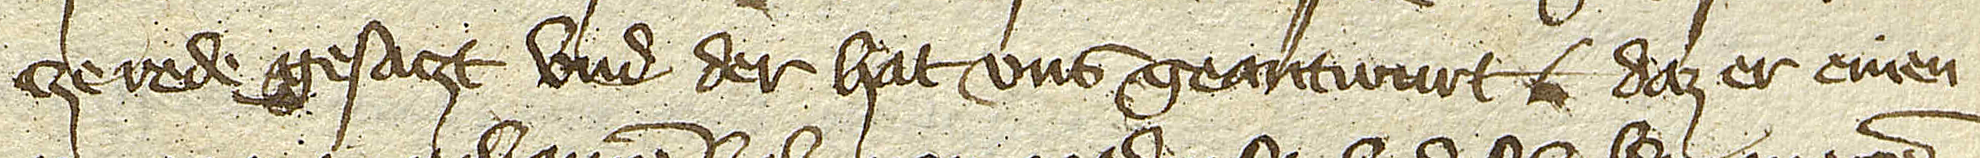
cʒe rede geſacʒt vnd der hat vns geantwurt / daʒ er einen
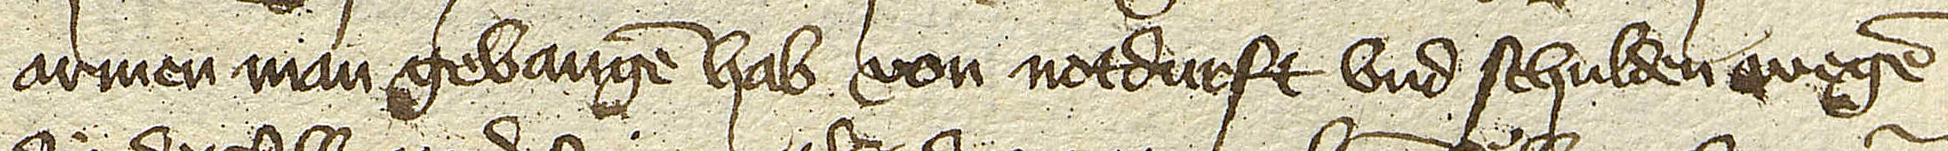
armen man gevange* hab von notdurft vnd ſchulden wege*
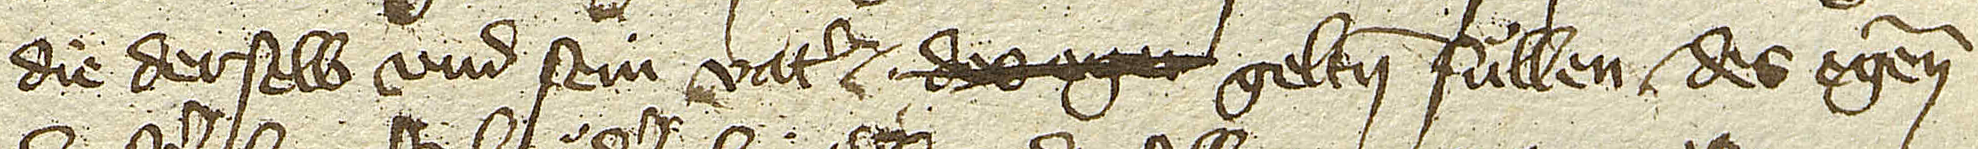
die derſelb vnd ſein vat* / . des egen geltn* ſüllen / des egen*
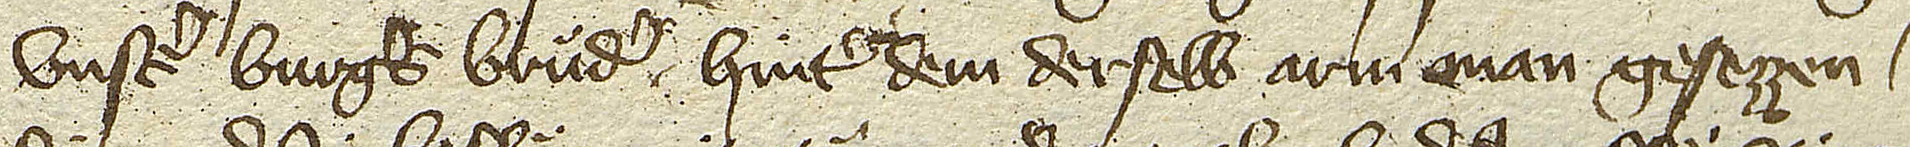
vnſs* burg*s brüd* / hint* dem derſelb arm man geſeʒʒen
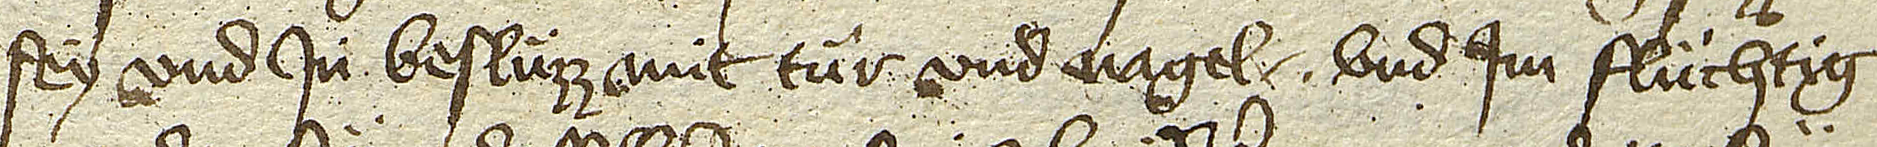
ſey vnd In beſlüʒʒ mit tür vnd nagel / . vnd Im flüchtig
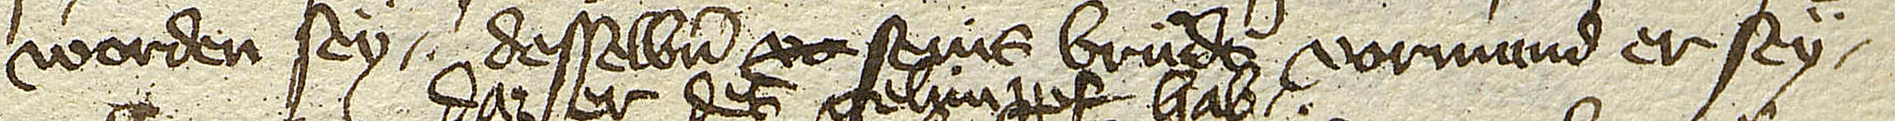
worden ſey / . deſſelbn* vo ſeins brüds* vormund er ſey /
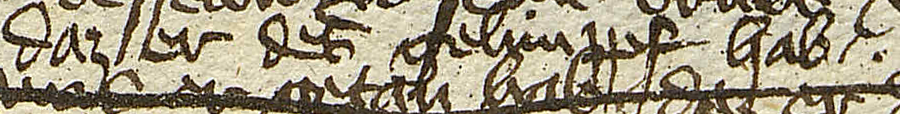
daʒ er des gelimppf hab / .
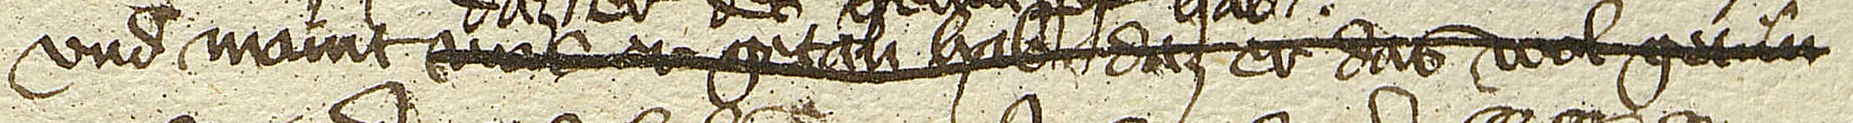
vnd maint was er getan hab / daʒ er das wol getün
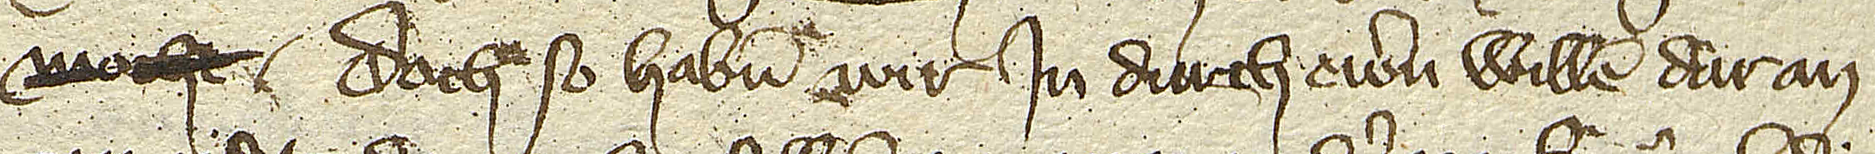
mocht / Doch ſo habn* wir In durch ew*n wille* daran
